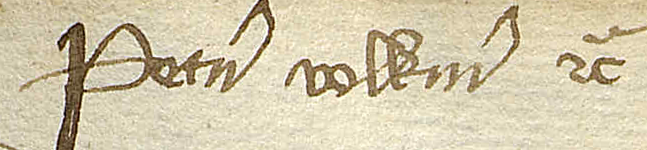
Pet*n volkm* ec*
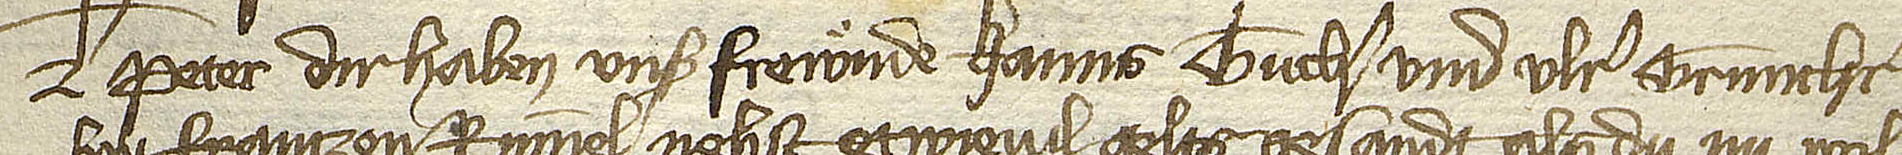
L* Peter dir haben vnſ* frewnde Hans Tuch* vnd vlr* Grunthr*
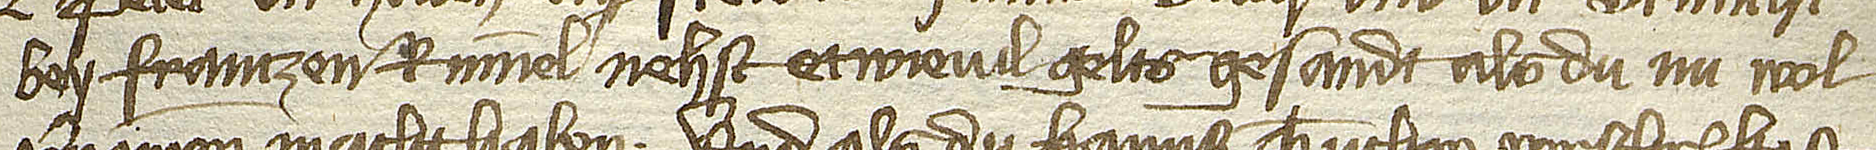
bey francʒen Rum*el nehſt etwieuil gelts geſandt als du nu wol
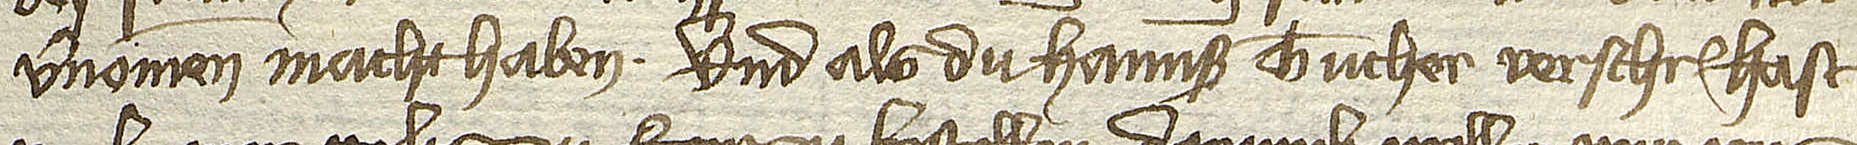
v*nom*en macht haben . Vnd als du hannſ* Tucher verſchr* haſt
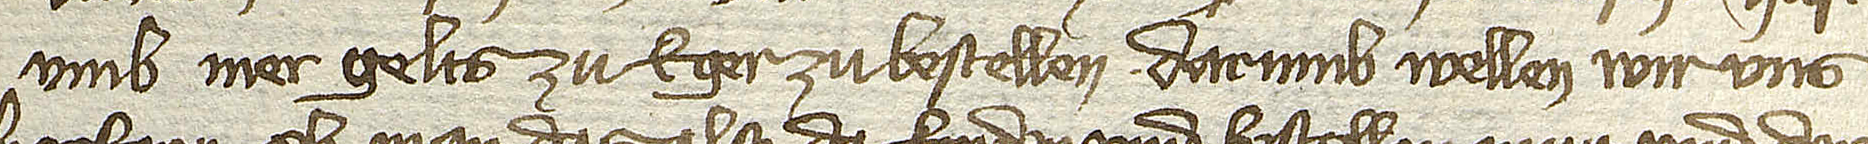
vmb mer gelts ʒu Eger ʒu beſtellen . darumb wellen wir vns
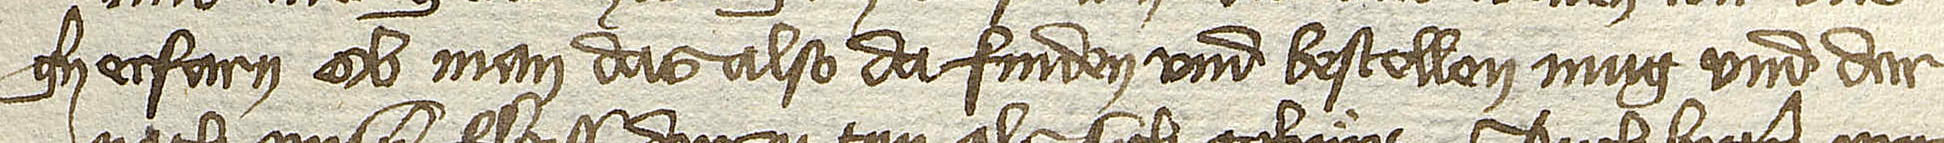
gn* erfarn ob man das alſo da finden vnd beſtellen mug vnd dar
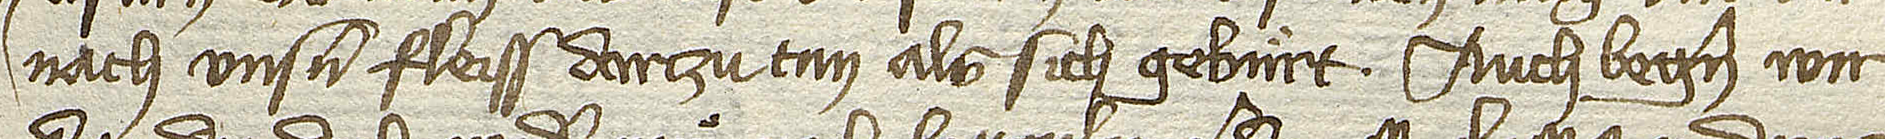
nach vnſ*n fleiſſ darcʒu tun als ſich gebürt . Auch begn* wir
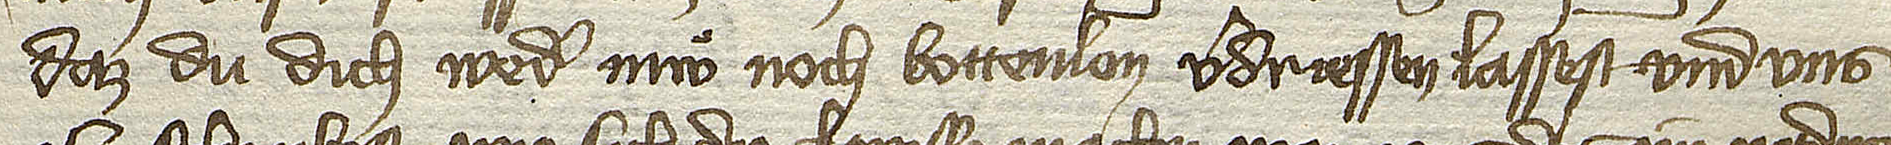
daʒ du dich wed* mw noch bottenlon v*drieſſen laſſeſt vnd vns
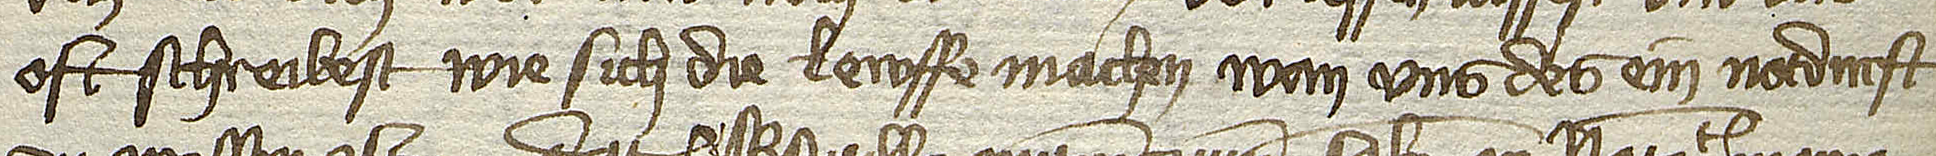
oft ſchreibeſt wie ſich die lewffe machen wan vns des ein notdurft
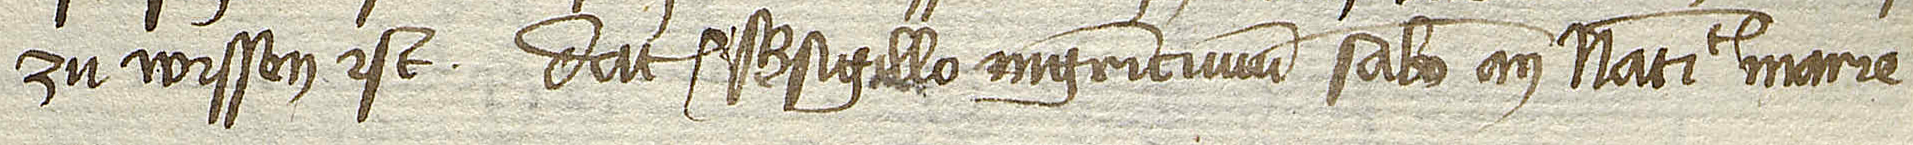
ʒu wiſſen iſt . Dat* ſB* ſigillo mgri*ciui ſabo* an* Nati* marie
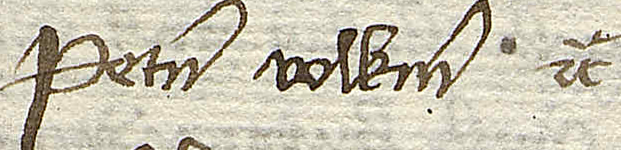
Pet*n volkm* ec*
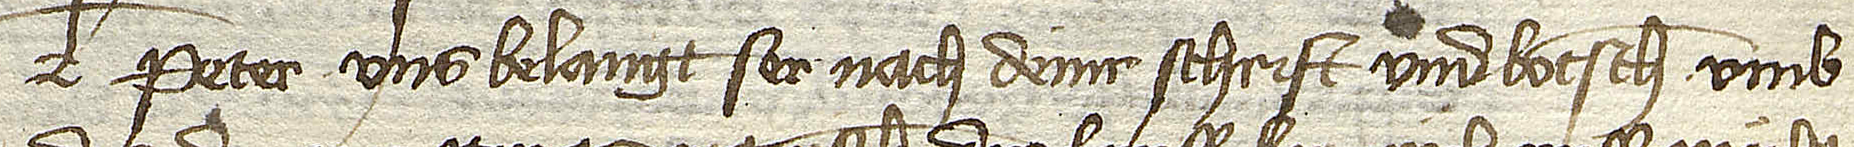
L* Peter vns belangt ſer nach deinr ſchrift vnd botſch* vmb
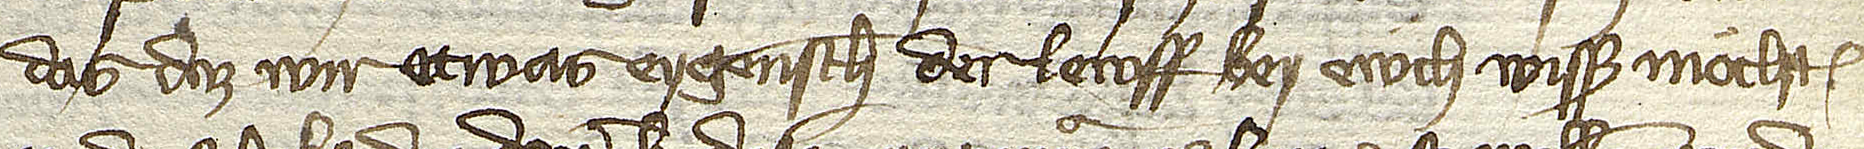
das daʒ wir etws eygenſch* der lewff bey ewch wiſſ* möcht*
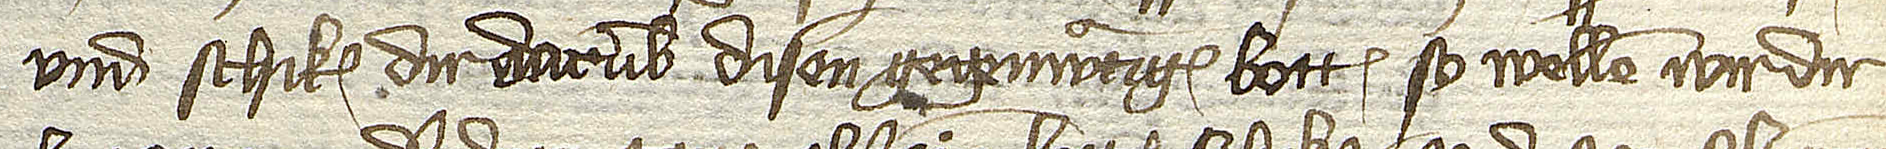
vnd ſchik* dir darub* diſen gegenw*tig* bott* ſo welle* wir dir
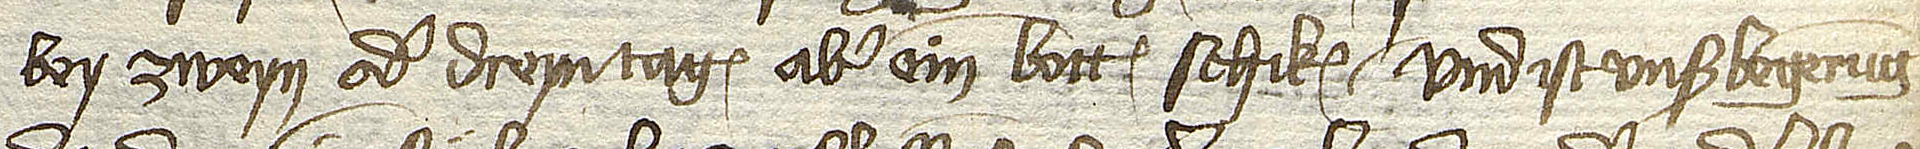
bey ʒweyn od* dreyn tag* ab* ein bott* ſchik* / Vnd iſt vnſ* begerug*
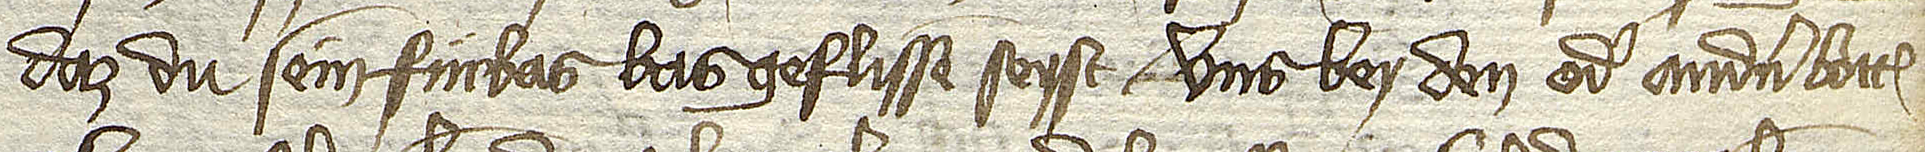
daʒ du ſein fürbas bas gefliſſe* ſeyſt / Vns bey den od* and*n bott*
